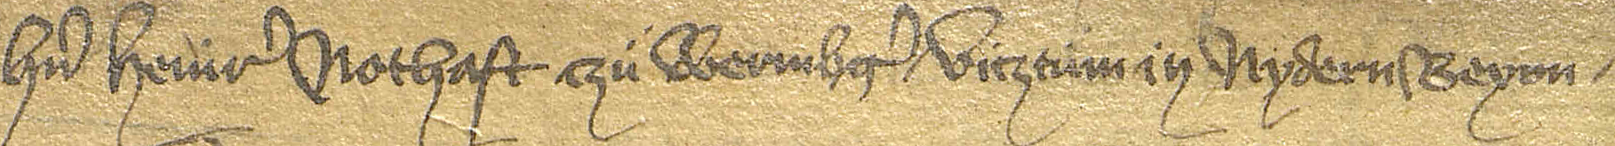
hn* heinr* Nothaft cʒü Wermbg* / Vicʒtüm in Nydern Beyrn /
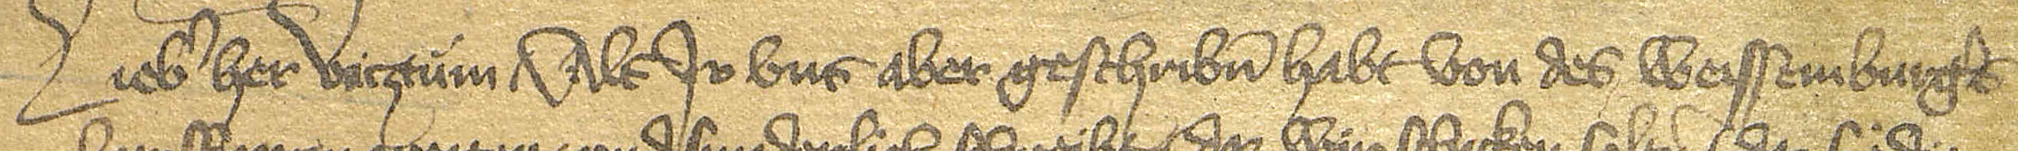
Lieb* her Vicʒtüm / Als Ir vns aber geſchribn* habt von des weiſſemburg*s
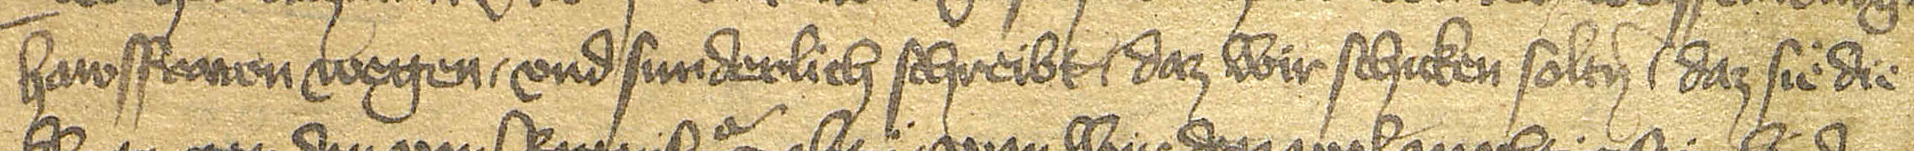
hawſfrawn wegen / vnd ſunderlich ſchreibt / daʒ wir ſchicken ſoltn* / daʒ ſie die
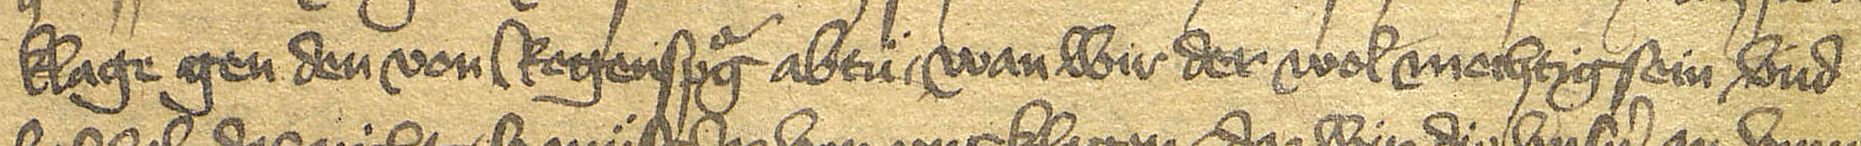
klage gen den von Regenſp*g abtü / wan wir der wol mechtig ſein / vnd
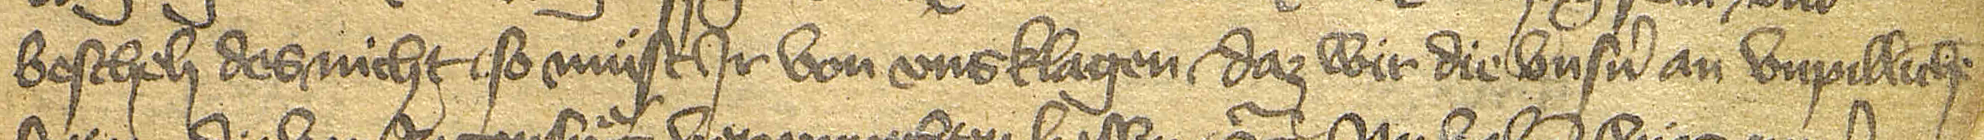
beſcheh des nicht / ſo müſt Ir von vns klagen / daʒ wir die vnſn* an vnpilliche*
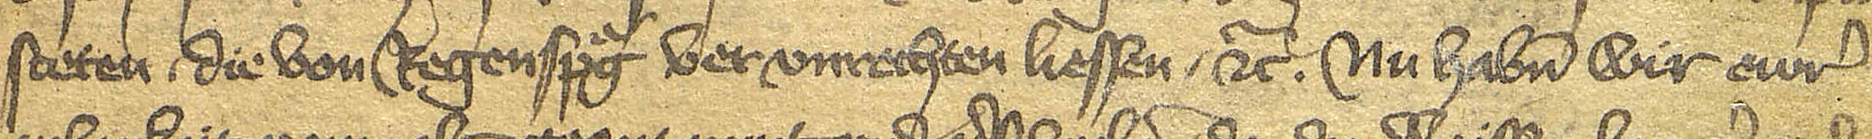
ſteten / die von Regenſp*g verunrechten lieſſen / ec* . Nu habn* wir ewr*
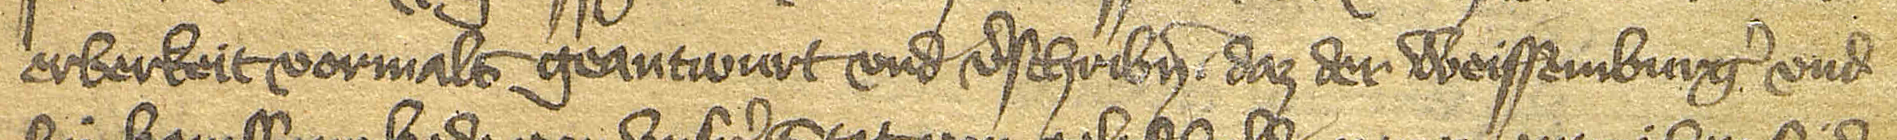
erberkeit vormals geantwurt vnd v*ſchribn* / daʒ der Weiſſemburg* vnd
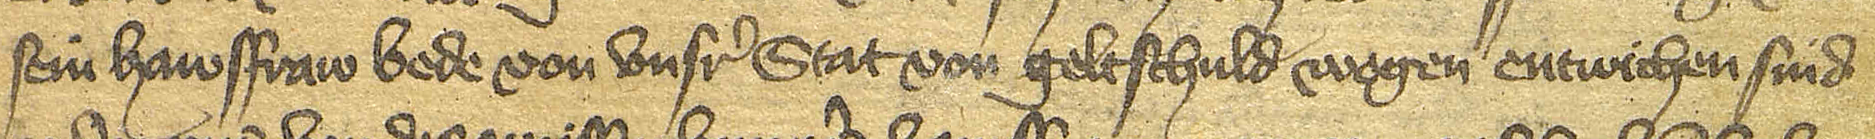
ſein hawſfraw bede von vnſr* Stat von geltſchuld wegen entwichen ſind
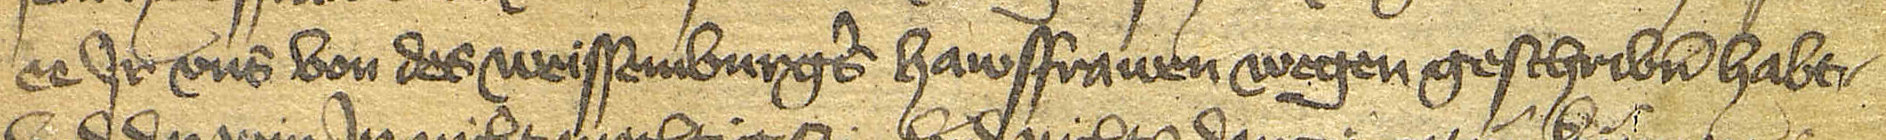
ee Ir vns von des weiſſemburgs* hawſfrawen wegen geſchribn* habt /
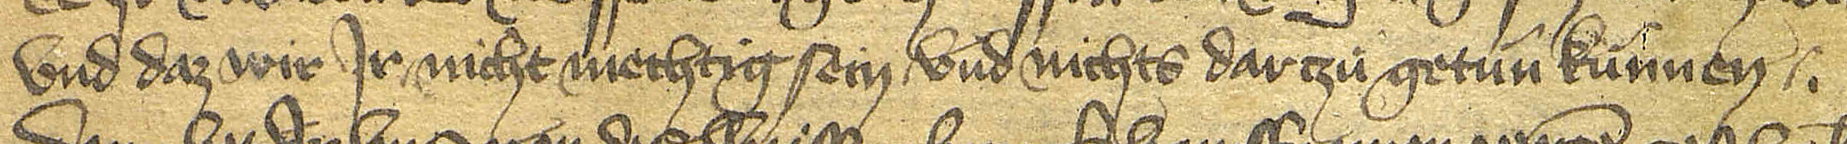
vnd daʒ wir Ir nicht mechtig ſein / vnd nichts darcʒü getün künnen / .
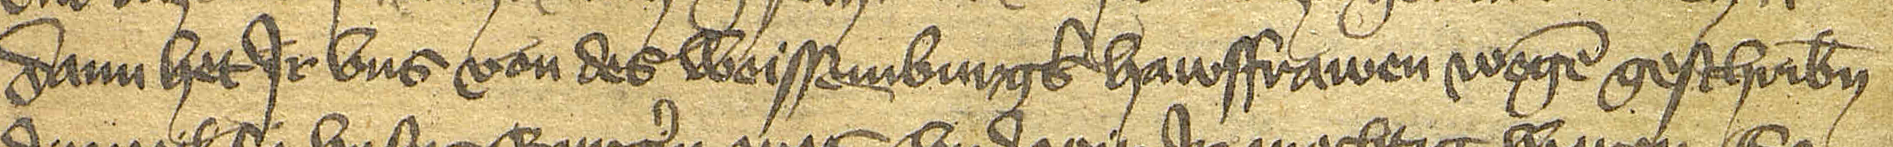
Dann het Ir vns von des Weiſſemburgs* hawſfrawen wege* geſchribn*
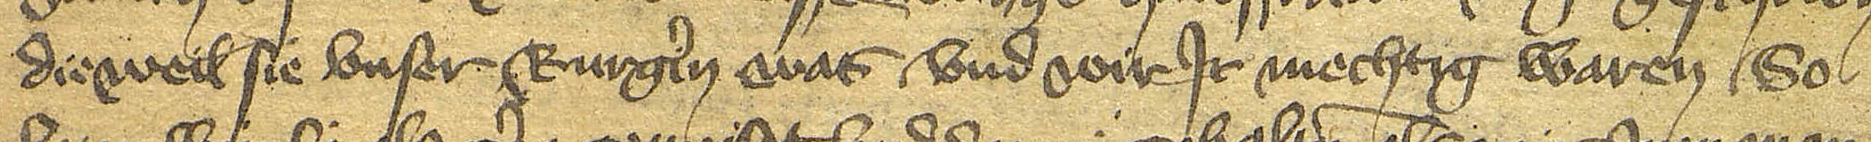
die weil ſie vnſer Burg*in was / vnd wir Ir mechtig waren / So
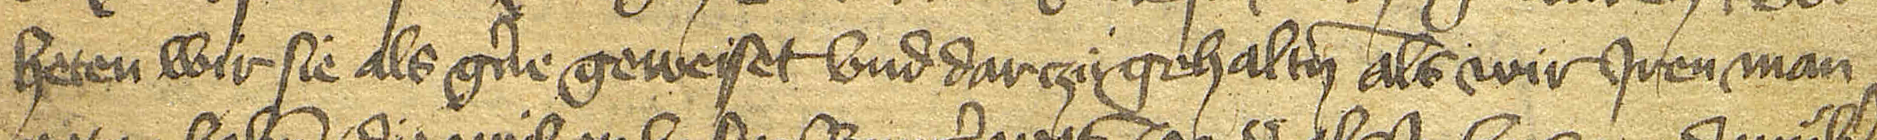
heten wir ſie als g*ne geweiſet vnd darcʒü gehaltn* als wir Iren man
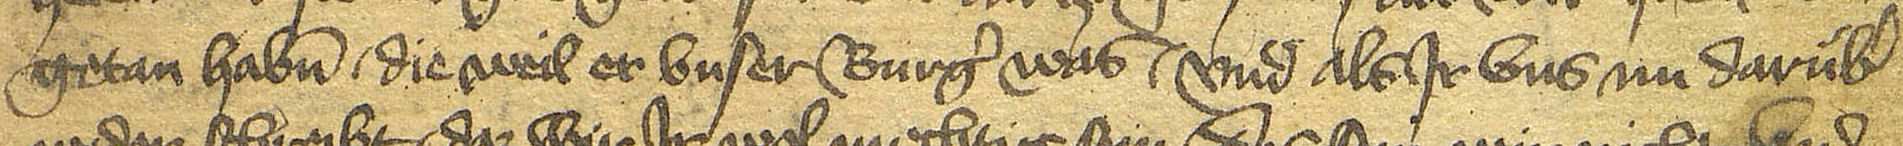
getan habn* / die weil er vnſer Burg* was / vnd als Ir vns nu darüb*
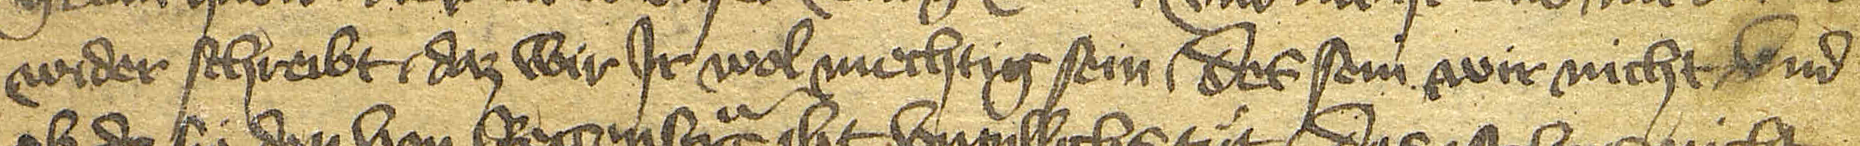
wider ſchreibt / daʒ wir Ir wol mechtig ſein / Des ſein wir nicht / Vnd
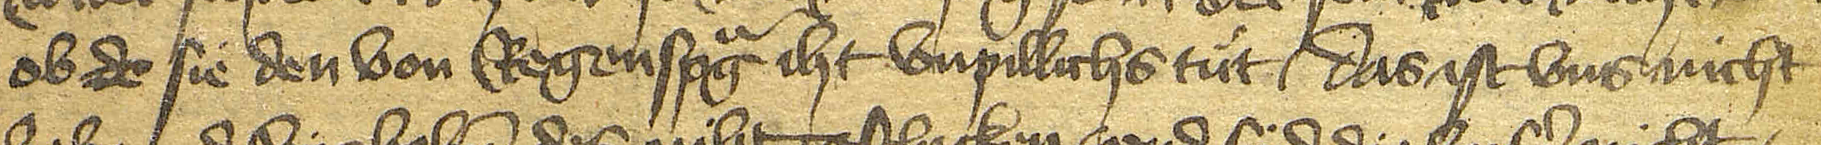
ob de ſie den von Regensp*g iht vnpillichs tüt / Das iſt vns nicht
